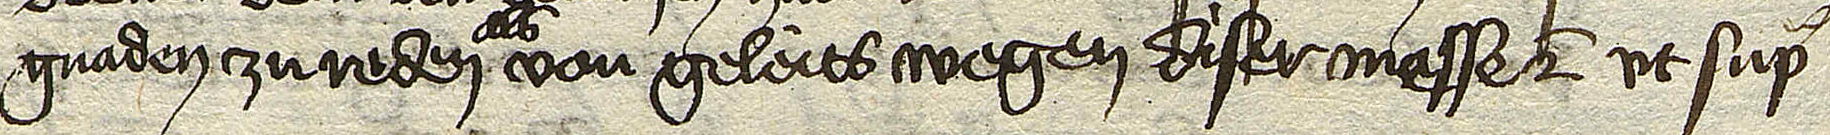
gnaden ʒu reden von geleits wegen diſer maſſe ec* vt ſup*
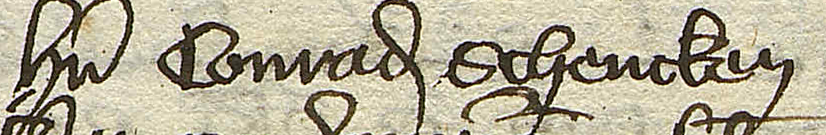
h*n Conrad Schencken
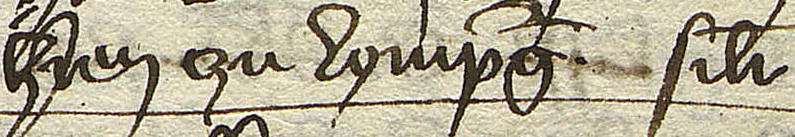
h*ren cʒu Lymp*g ſilr*
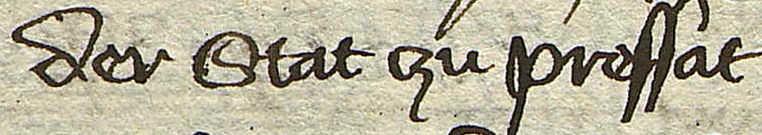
Der Stat cʒu preſſat
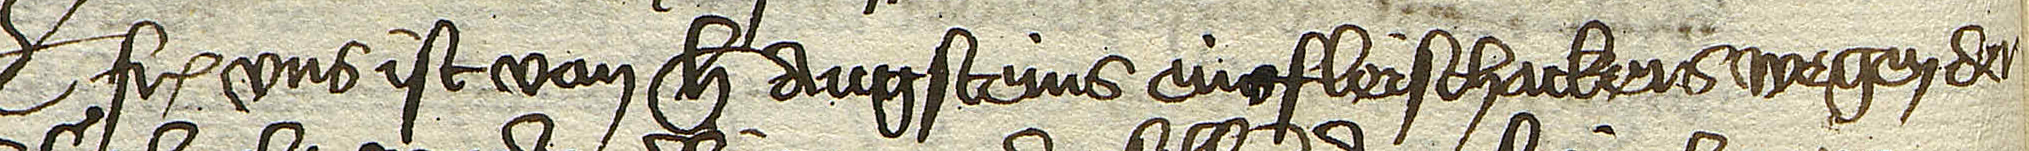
L* fr* vns iſt von h* Augſteins eins fleiſchackers wegen der
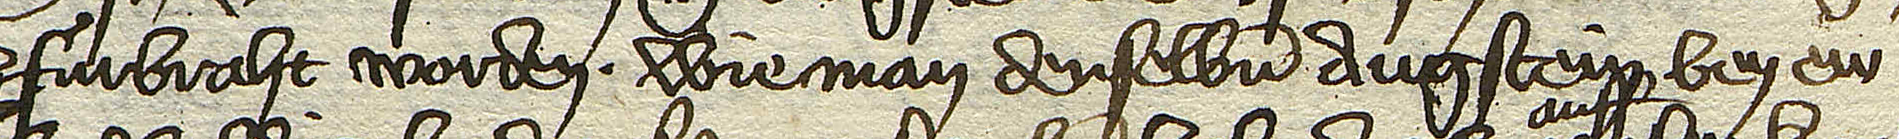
fürbraht worden . wie man denſelb*n Augſtein bey ew
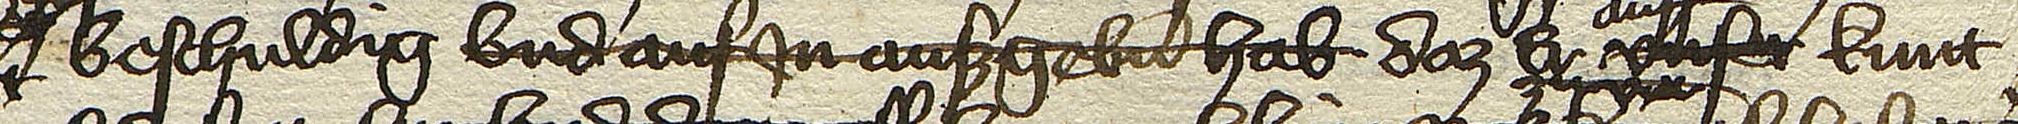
beſchuldig vnd auf In auſʒgeb*n hab daʒ Er vnſer kunt
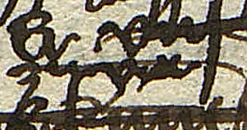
ʒu vor
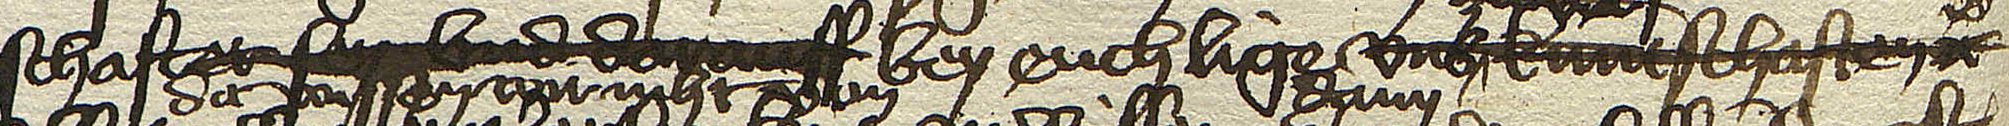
ſchafter ſey vnd darauff bey euch lige vns kuntſchaften ec*
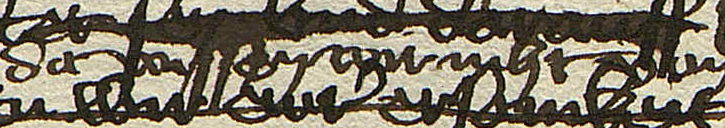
da wiſſen wir niht von
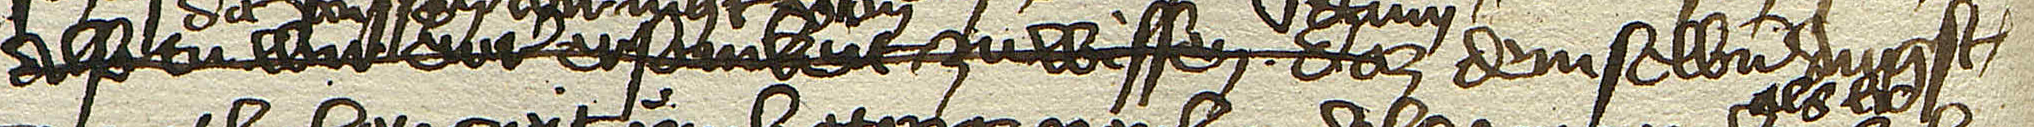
Alſo tu wir ewr* erſamkeit ʒu wiſſen . daʒ demſelb*n Augſt
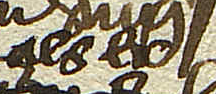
als Er
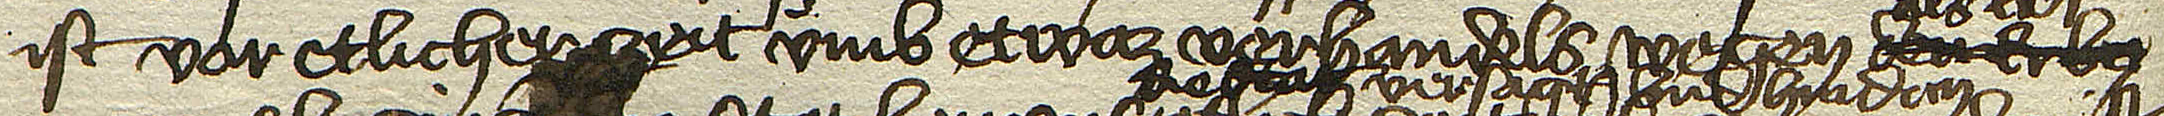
iſt vor etlicher ʒeit v̈mb etwaʒ verhandels wegen den Erbe*
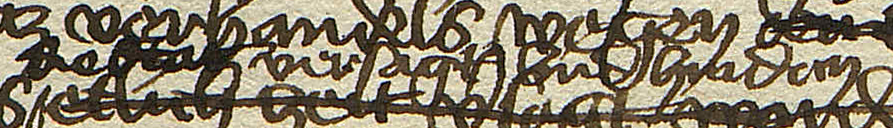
die Stat verſagt* Vnd hie dan
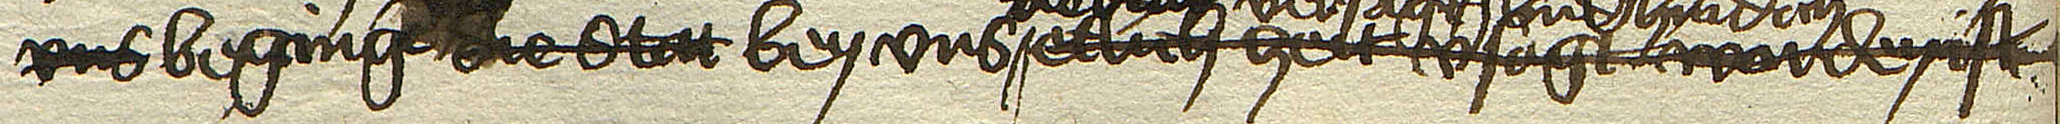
vns ginge* die Stat bey vns etlich ʒeit v*ſagt worden iſt
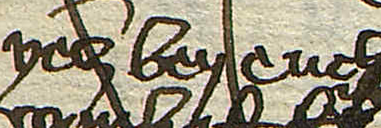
yecʒ* bey euch
